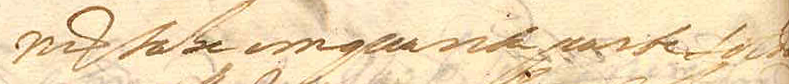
naõ sabe em quanta parte so
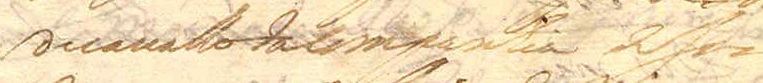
de cauallo da companhia de Joaõ
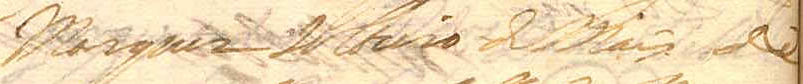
Marquez solteiro de Mais de
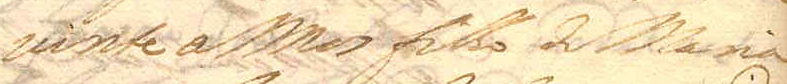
vinte annos filho de Maria
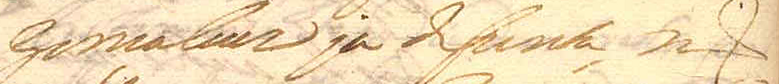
Goncalvez ja defunta, naõ
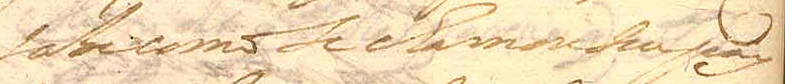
sabe como se chamou seu pay
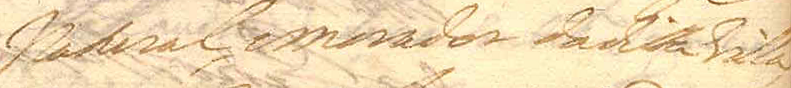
natural, e morador da dita Villa
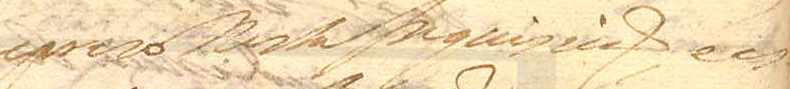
e prezo Nesta Inquizicaõ e es
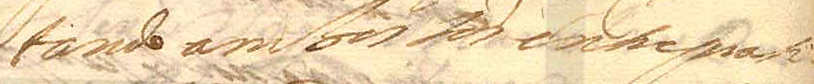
tando ambos sós entre prati
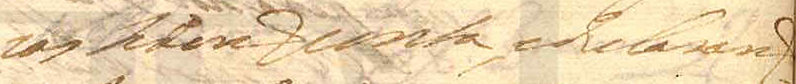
cas se derão conta, e dclararaõ
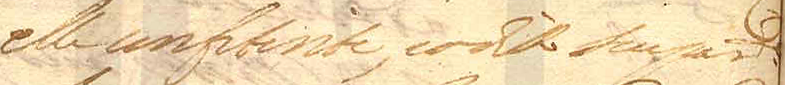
elle confitente, e o dito seu par.te
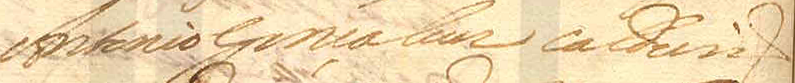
Antonio Gonçaluez Caldeiraõ
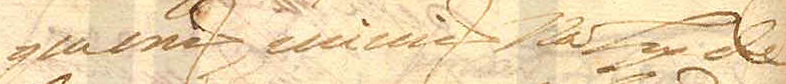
que enaõ, e uiuiaõ na Ley de
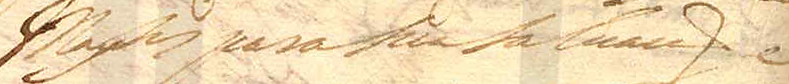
Moyzes para sua saluacaõ e
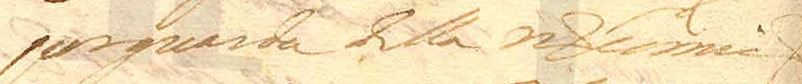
por guarda della naõ comiaõ
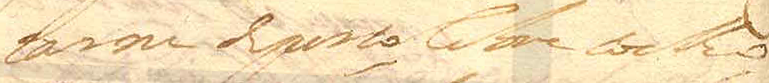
carne de porco, lebre coelho
